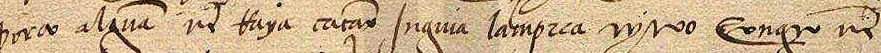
porco algūa nē Raya cação Jnguia lamprea eyroo Congro nē
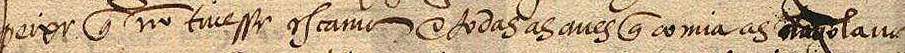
peixe q̄ n̄o tiuesse escama e todas as aues q̄ comia as degolaua
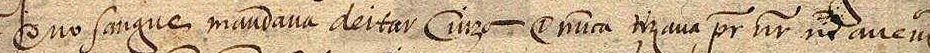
e no sangue mandaua deitar Cinza e nūca Rezaua p̄r n̄r nē aue ma
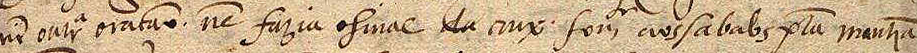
nē outra oração. n̄e fazia o sinal da crux. somte aos sabados p̄la manhã
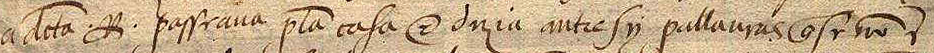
a d̄cta .R. passeaua p̄la casa e dizia antre sy pallauras q̄ se n̄o ē
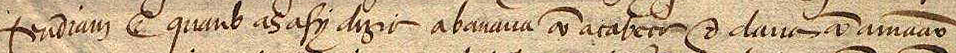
tendiam e quando as asy dizia abanaua c̄o a cabeça e daua c̄o a maão
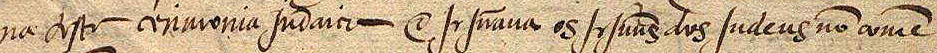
na testa cerimonia Judaica e Jejūaua os Jejūus dos Judeus n̄o com̄e
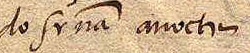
do sen̄a a nocte
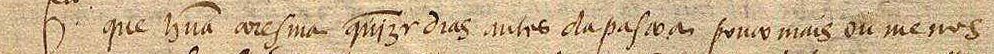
Pra. que hūa coresma q̄ujze dias antes da pascoa pouco mais ou menos
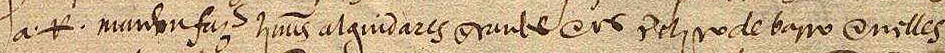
a .R. mandou faz̄ hūus alguidares grandes e os ēcheo de barro e nelles
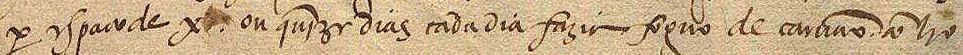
ꝑ espaco de x. ou q̄ujze dias cada dia fazia foguo de caruão cō ho
